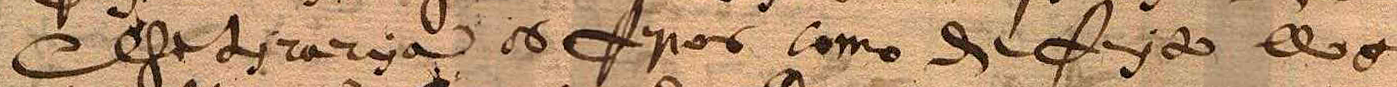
e lhe tjraryā os ferros como de feyto llogo
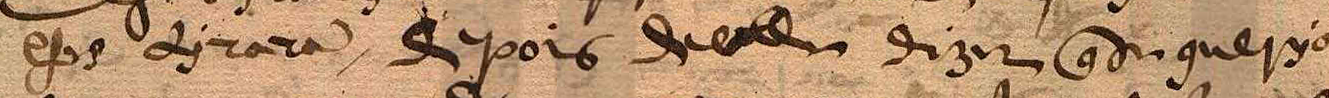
lhos tyrarā, depois de elle dizer q̄ se querya
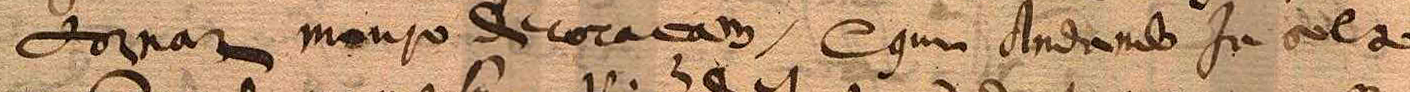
tornar mouro de coraçam / e que Andando Ja solto
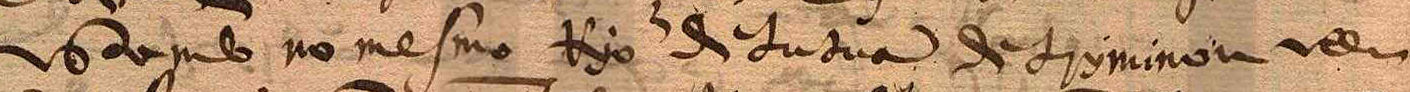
estamdo no mesmo Ryo de tutuā detryminou elle
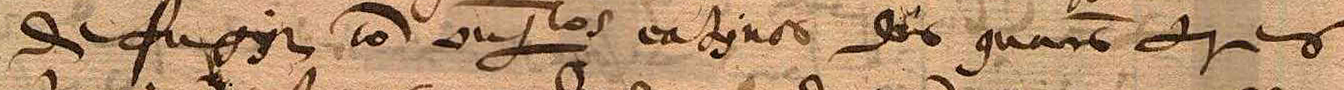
de fugyr c̄o outros catyuos dos quaēs tres
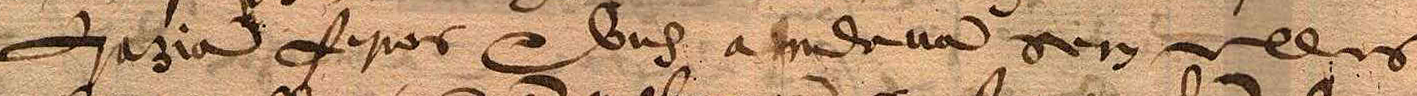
traziā ferros e dous amdauā sem elles
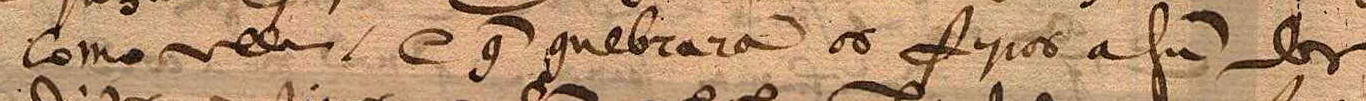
como ella / e q̄ quebrarā os ferros a hū dos
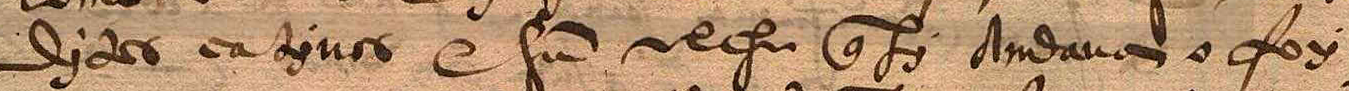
djtos catyuos e hu̅ elche q̅ hy Amdaua o foy
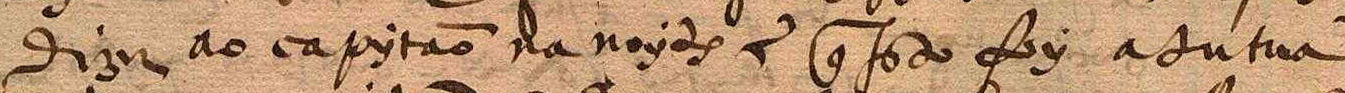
dizer ao capytão na noytꝭ e̅ q̅ Jsto foy a tutuā
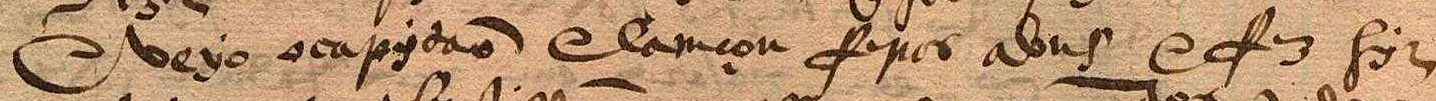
e veyo o capytaõ e lamçou foros a dous e fez hyr
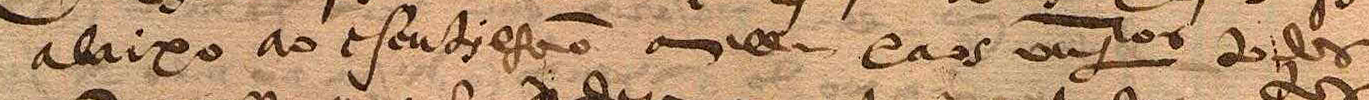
abaixo ao escutylhão a elle e aos outros todos
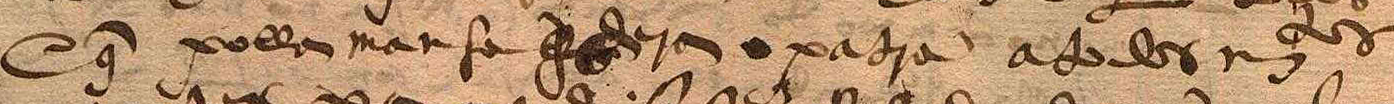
e q̄ polla manha lhe dera o patrā a todos mtos
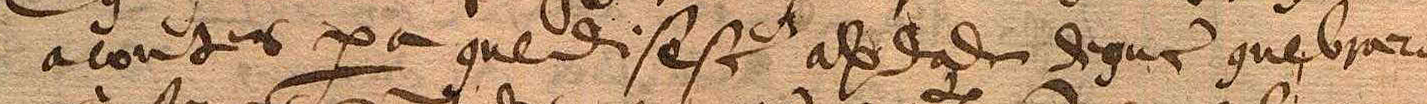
açoutes ꝑa que disese a ꝟdade de quē quebrara
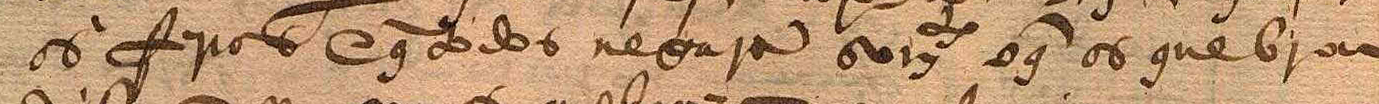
os ferros e q̄ todos negarā somtꝭ o q̄ os quebrou
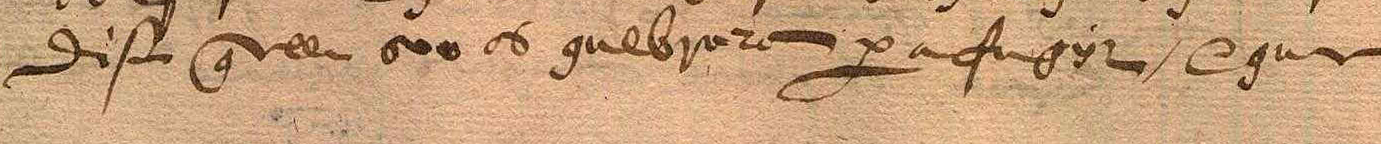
dise q̅ elle soo os quebrara ꝑa fugyr / e que
